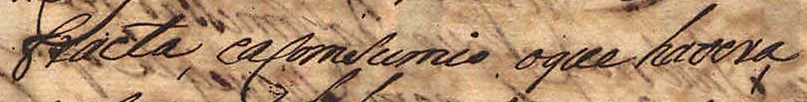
fracta, e a Comsumio o que havera
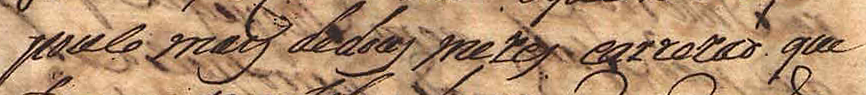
pouco mais de dous mezes e a rrezaõ que
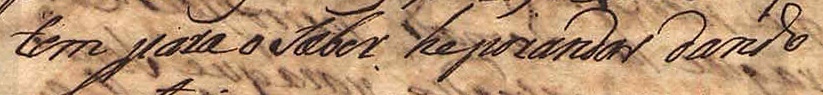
tem para o saber he por andar dando
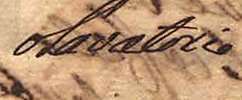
o lavatorio
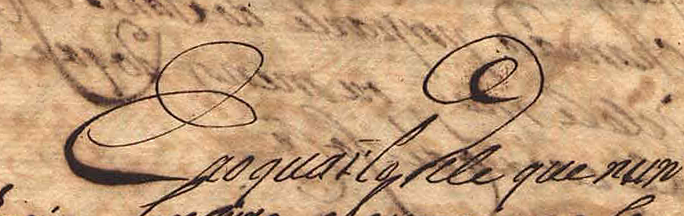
E ao quarto dice que nun
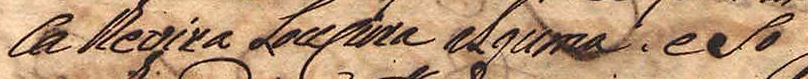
Ca lhe vira Loucura alguma. e so
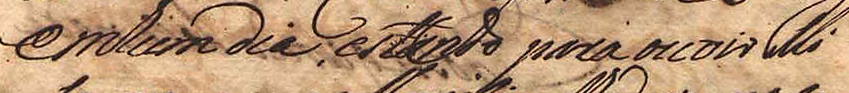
em hum dia: estando para ouvir Mi
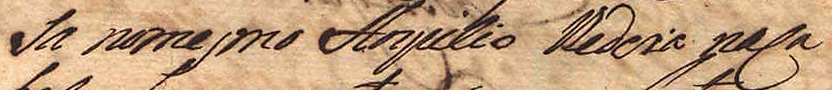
sa no mesmo HospiCio lhe dera na Ca
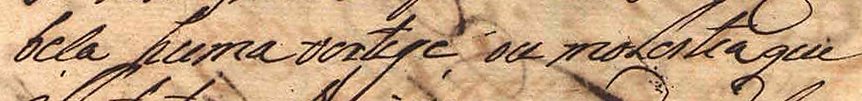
beÇa huma vertige, ou moLestia que
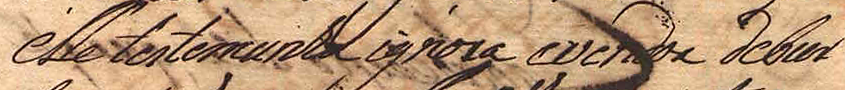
elle testemunha ignora e vendoa de bur
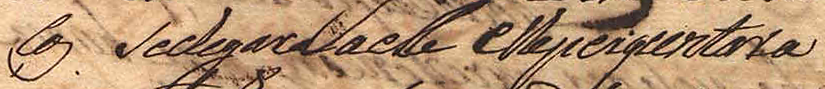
Ços se chegara a elle e lhe perguntara
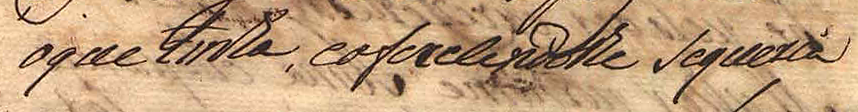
o que tinha, e oferecendolhe se queria
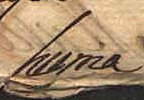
huma
